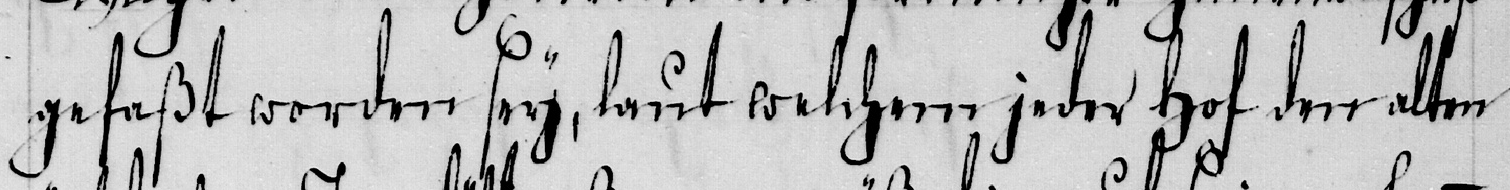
gefaßt worden sey, laut welchem jeder Hof den alten
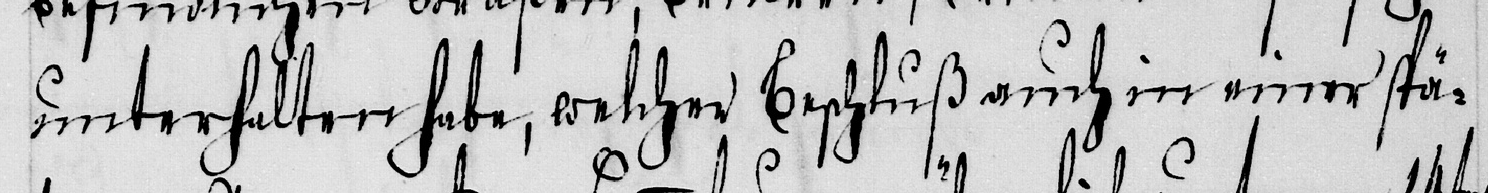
unterhalten habe, welcher Beschluß auch in einer spä¬
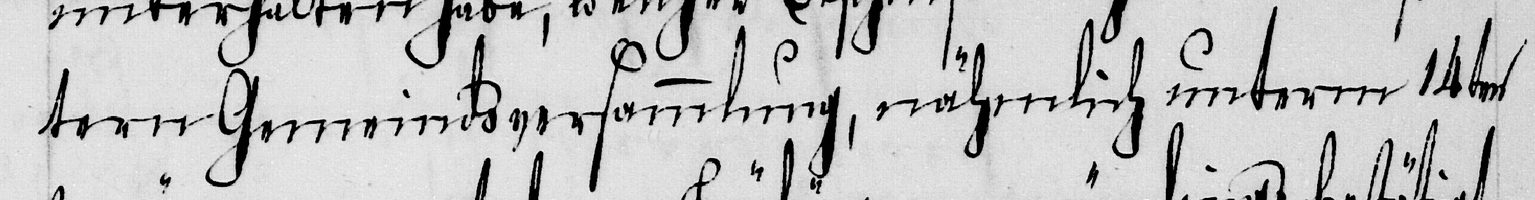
tern Gemeindsversammlung, nähmlich unterm 14ten
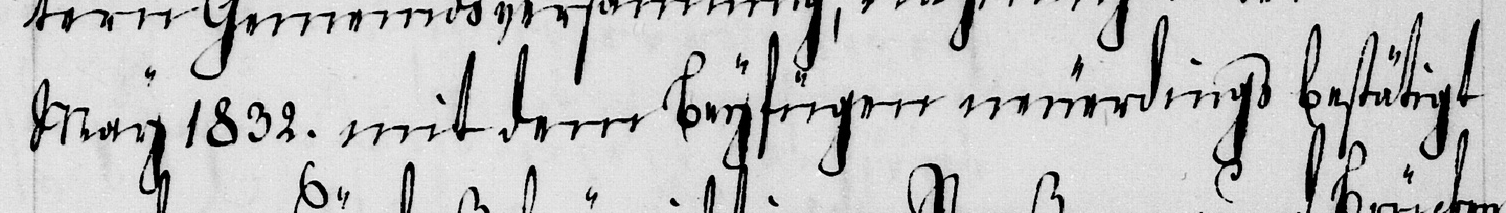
May 1832. mit dem Beyfügen neuerdings bestätigt
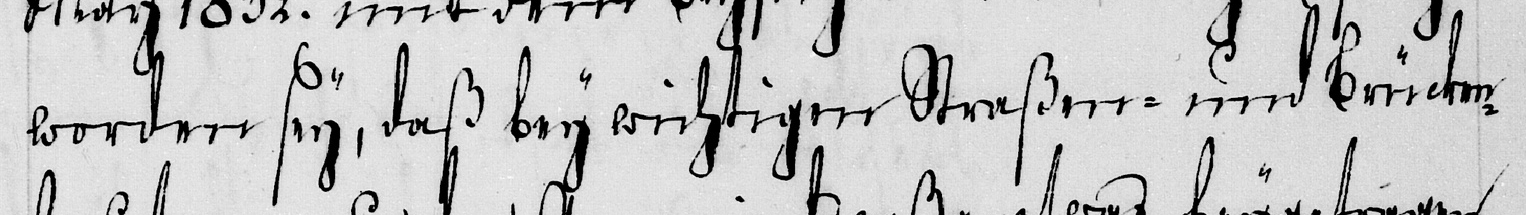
worden sey, daß bey wichtigen Straßen- und Brücken¬
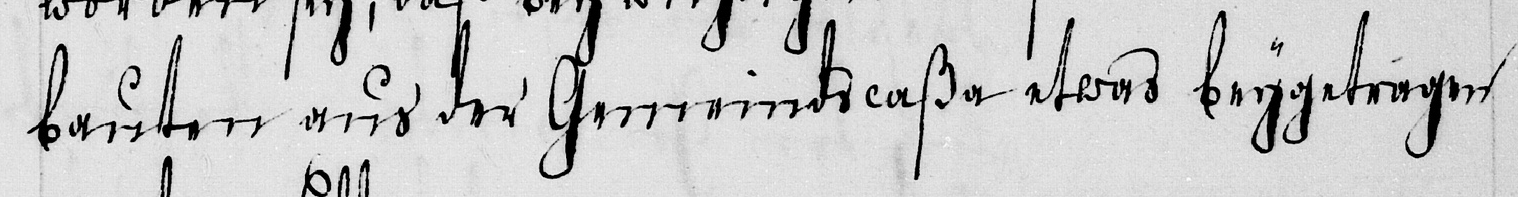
bauten aus der Gemeindscaßa etwas beygetragen
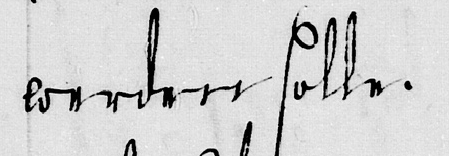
werden solle.
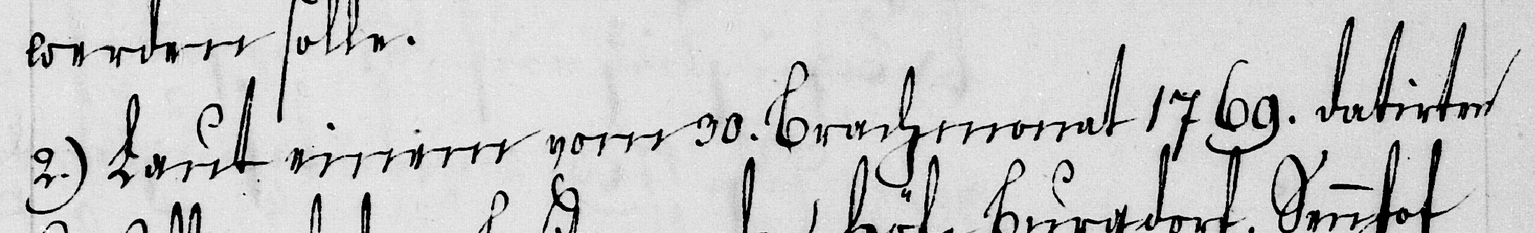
2.) Laut einem vom 30. Brachmonat 1769. datirten
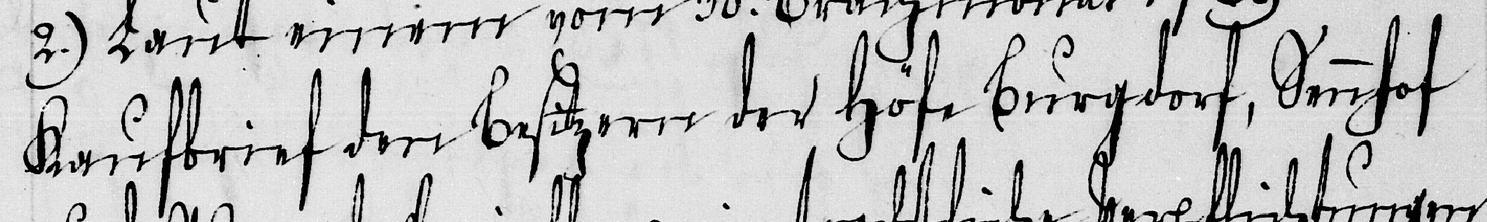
Kaufbrief den Besitzern der Höfe Burgdorf, Sennhof
